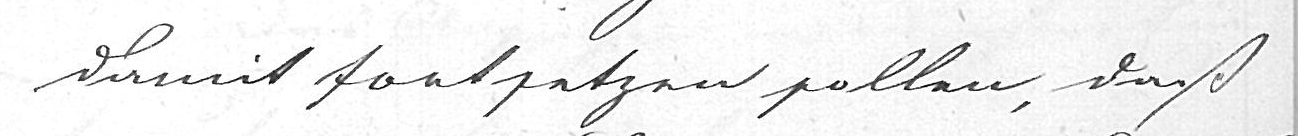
damit fortsetzen sollen, daß
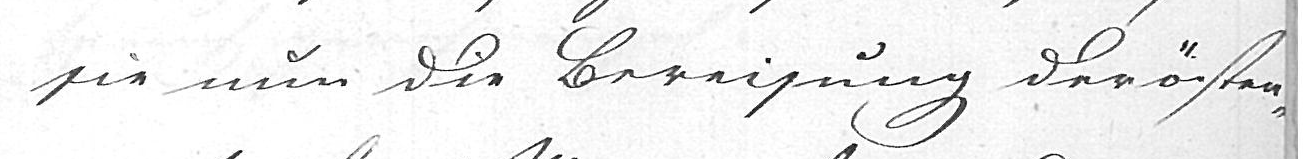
sie nun die Bereisung der öster-
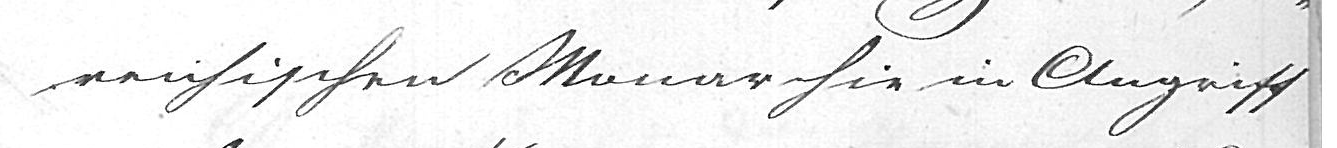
reichischen Monarchie in Angrif
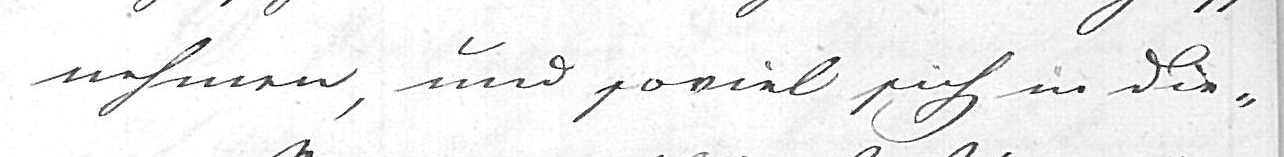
nehmen, und soviel sich in die-
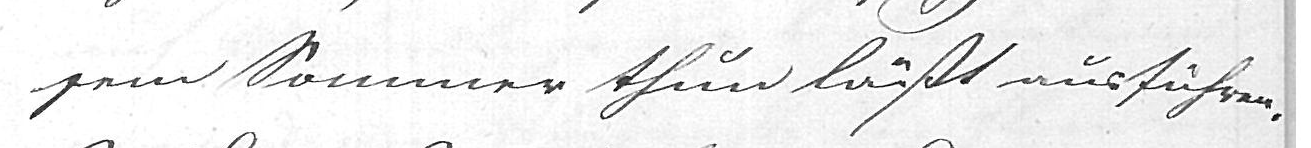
sem Sommer thun läßt ausführen.
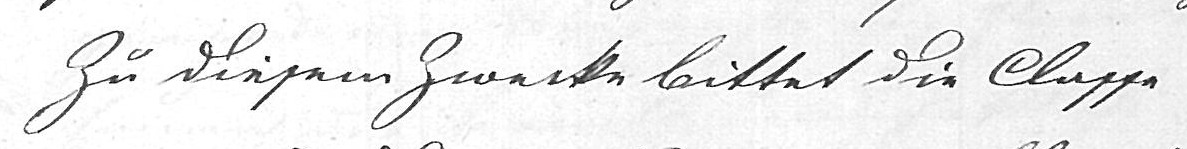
Zu diesen Zwecke bittet die Classe
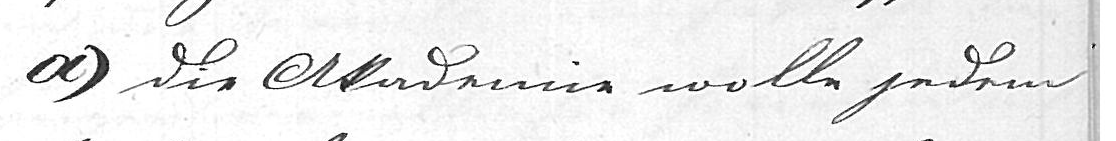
a) die Akademie wolle jedem
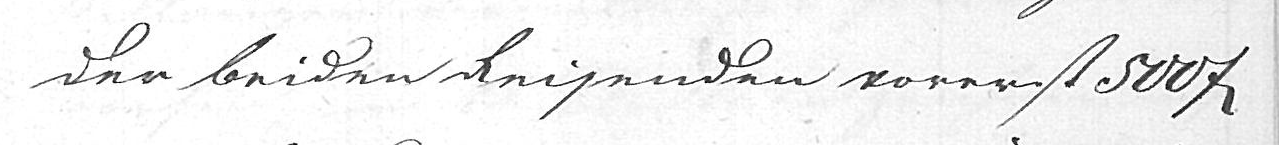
der beiden Reisenden vorerst 500 fl
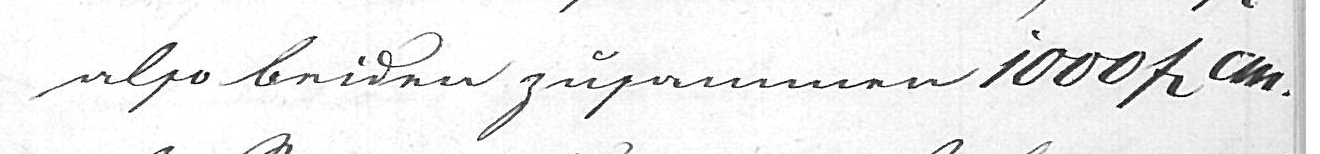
also beiden Zusammen 1000 fl CM
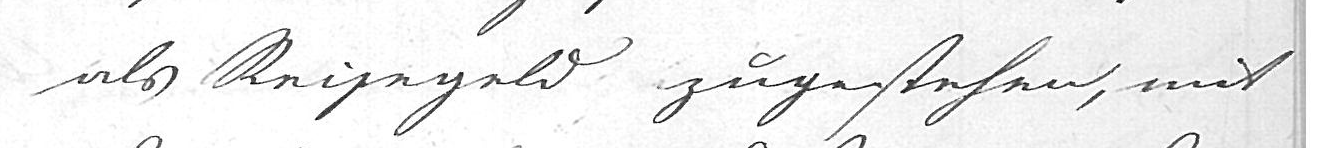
als Reisegeld zugestehen, mit
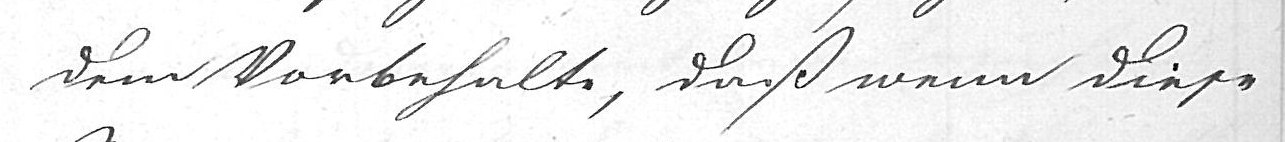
dem Vorbehalte, daß wenn diese
